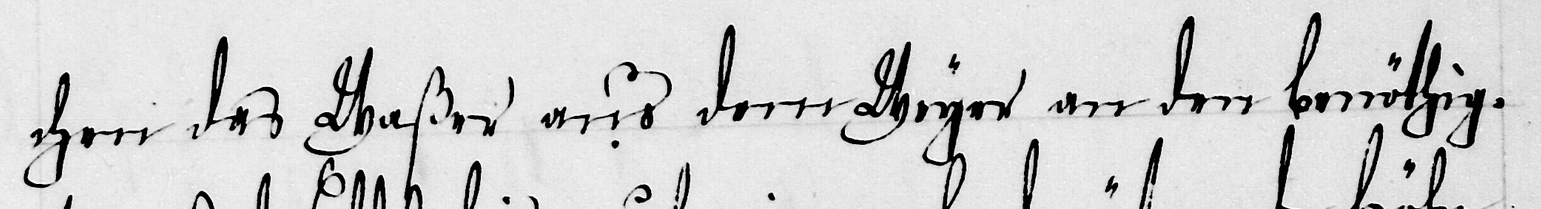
chen das Waßer aus dem Weyer an den benöthig¬
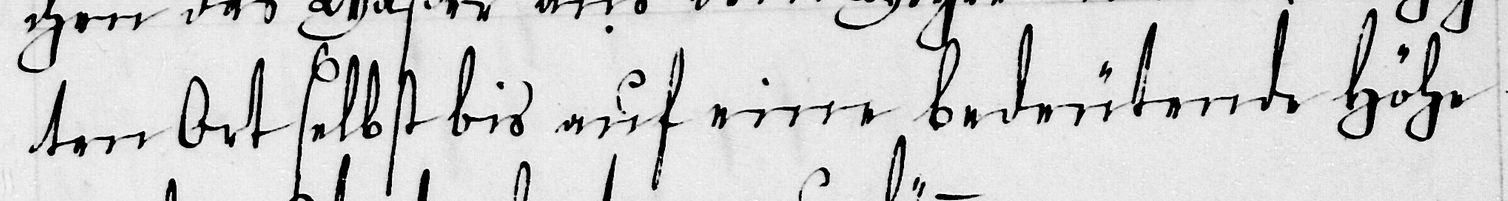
ten Ort selbst bis auf eine bedeutende Höhe
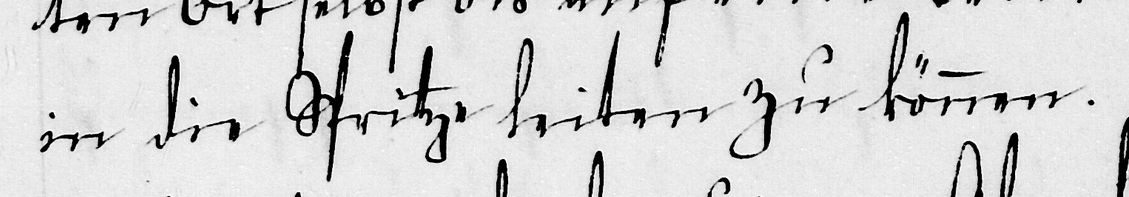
in die Spritze leiten zu können.
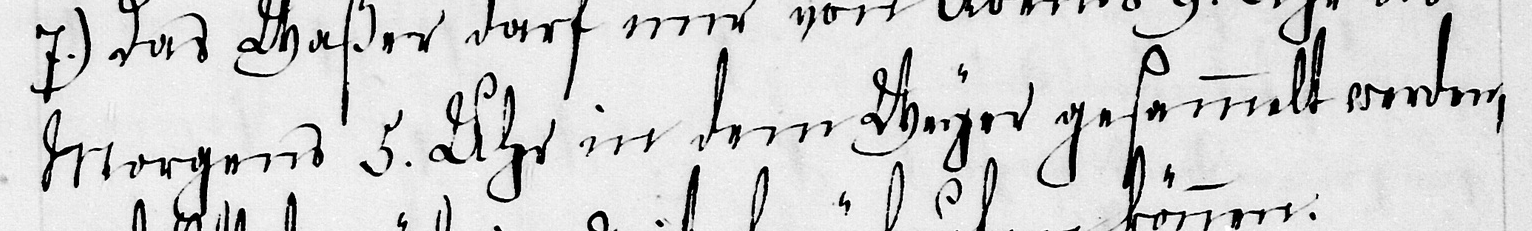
Morgens 5. Uhr in dem Weyer gesammelt werden,
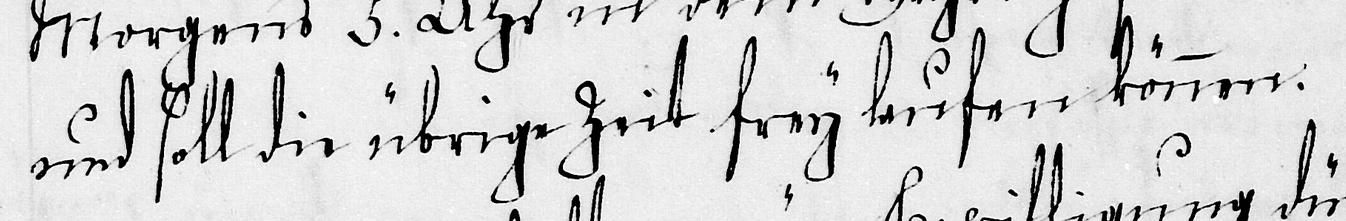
und soll die übrige Zeit frey laufen können.
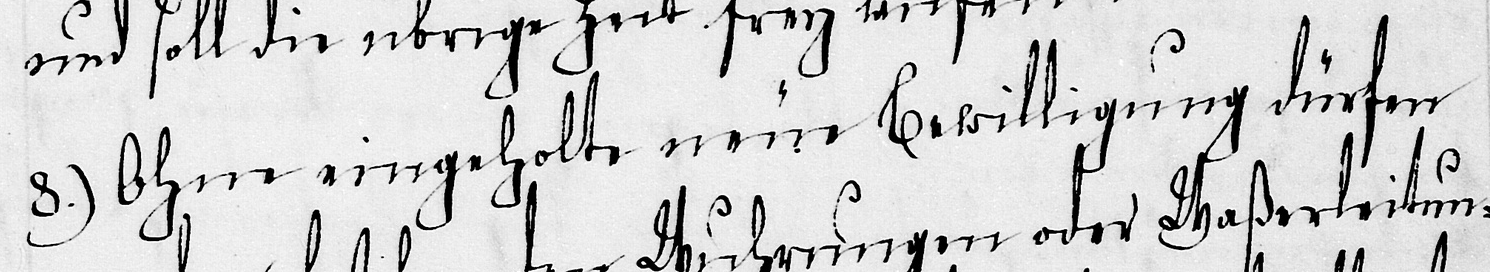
8.) Ohne eingeholte neue Bewilligung dürfen
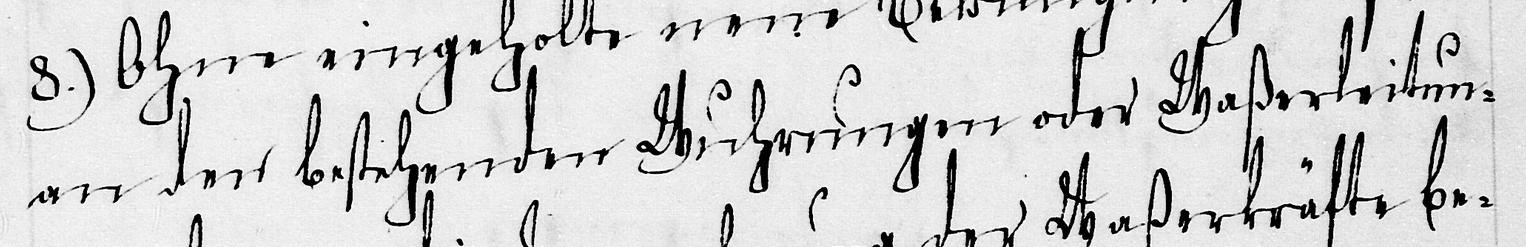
an den bestehenden Wuhrungen oder Waßerleitun¬
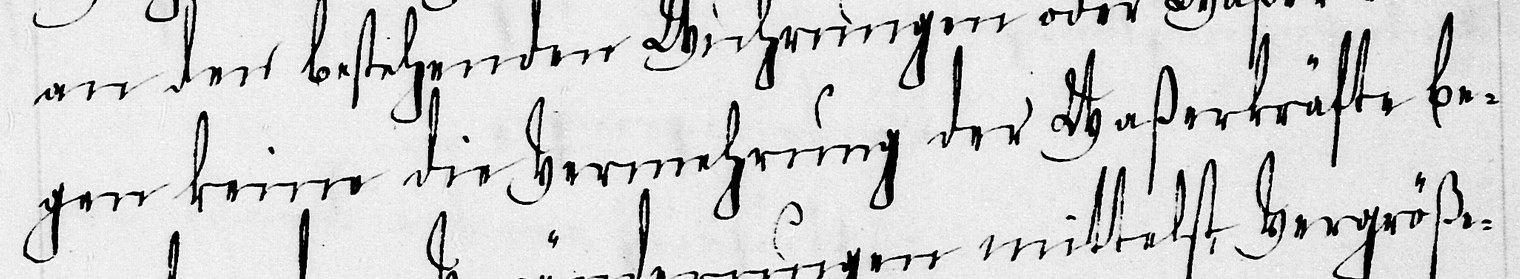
gen keine die Vermehrung der Waßerkräfte be¬
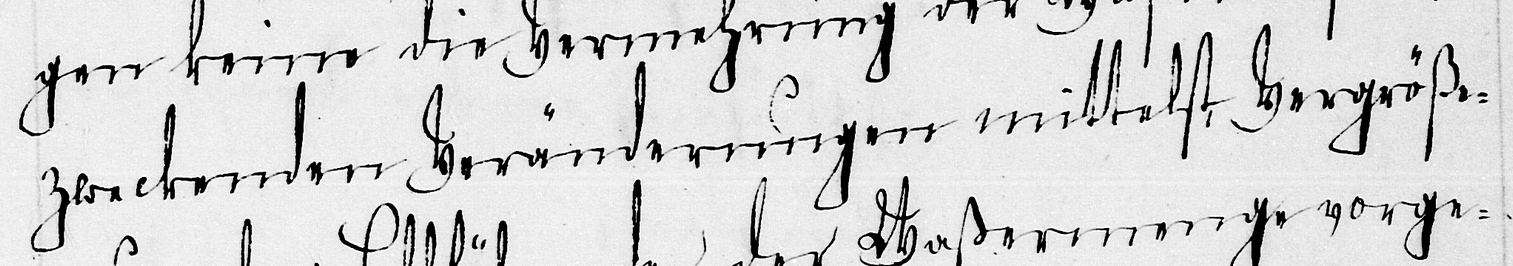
zweckenden Veränderungen mittelst Vergröße¬
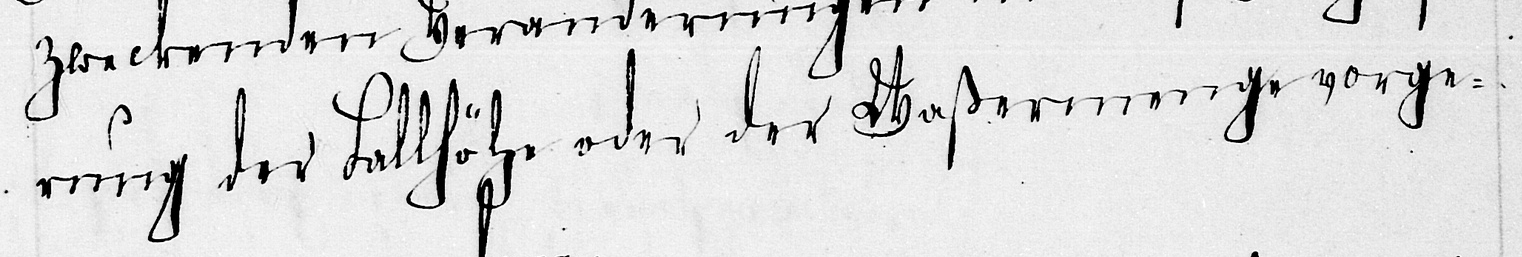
rung der Fallhöhe oder der Waßermenge vorge¬
